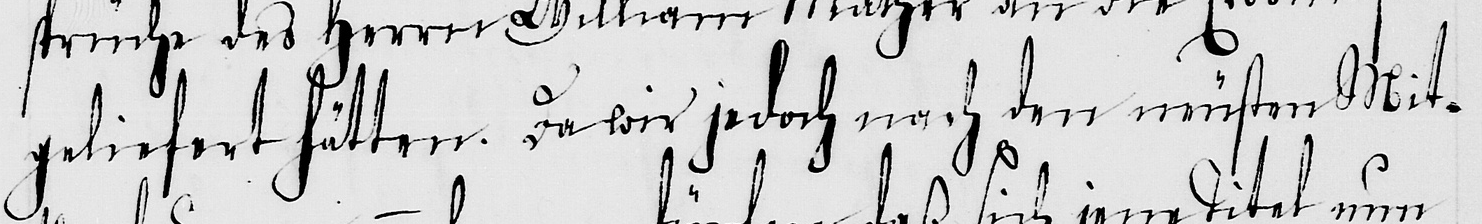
geleistet hätten. Da wir jedoch nach den neusten Mit¬
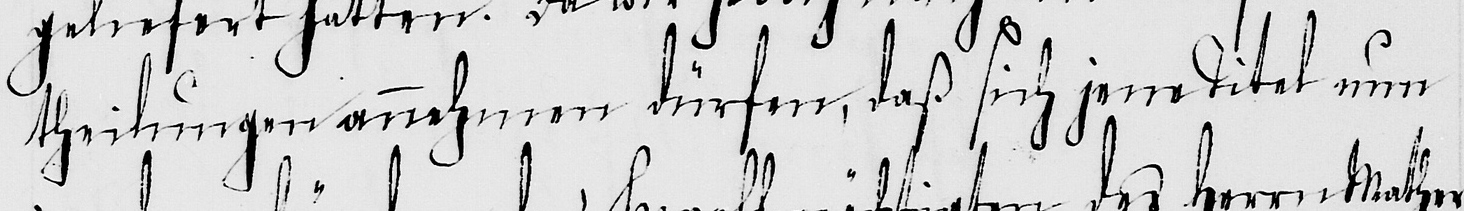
theilungen annehmen dürfen, daß sich jene Titel nun
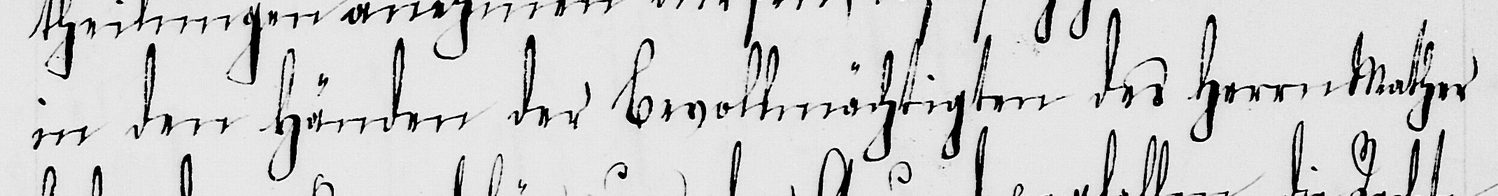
in den Händen der Bevollmächtigten des Herrn Mather
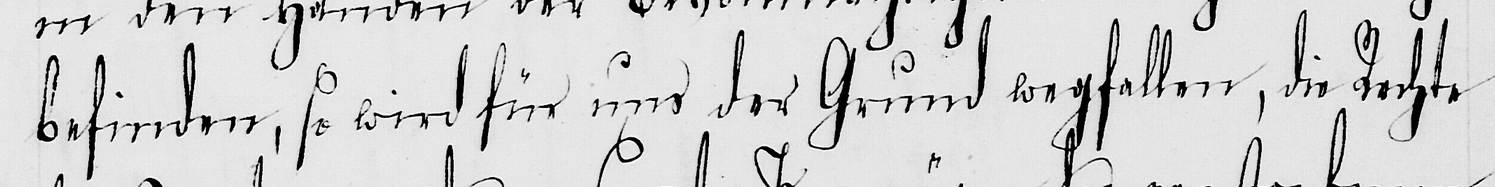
befinden, so wird für uns der Grund wegfallen, die Rechte
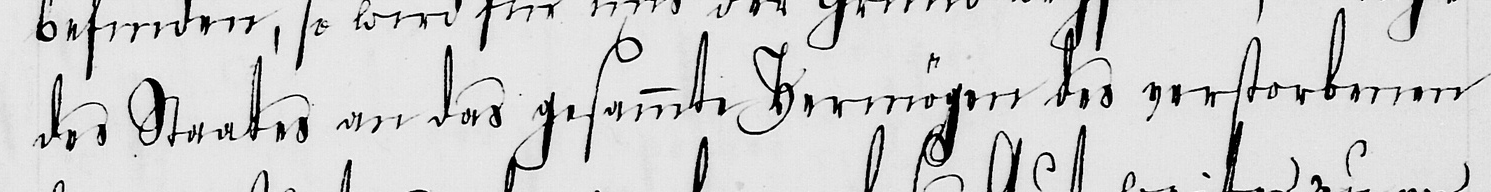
des Staates an das gesammte Vermögen des verstorbenen
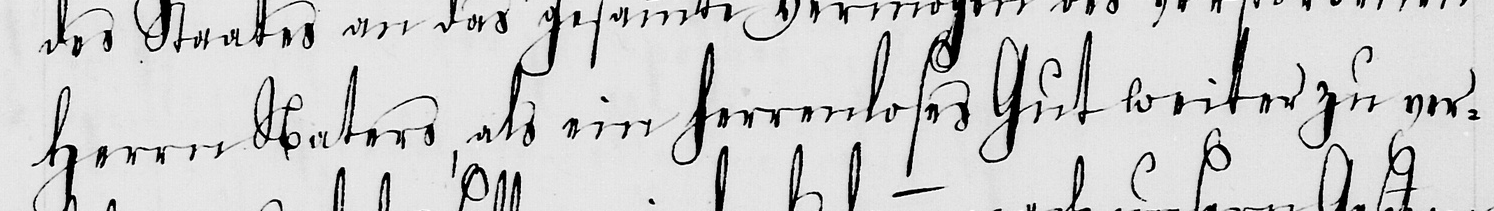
Herrn Naters, als ein herrenloses Gut weiter zu ver¬
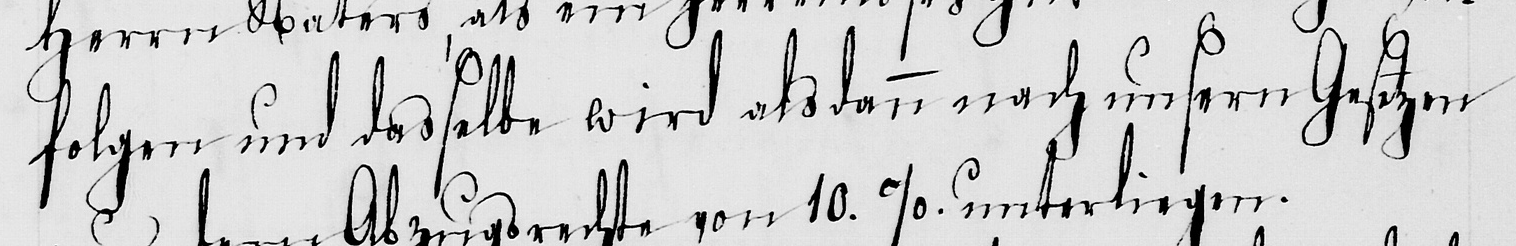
folgen und dasselbe wird alsdann nach unsern Gesetzen
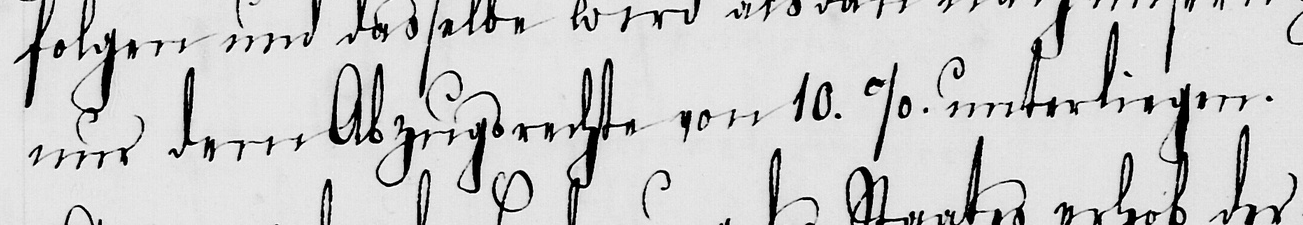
nur dem Abzugsrechte von 10. % unterliegen.
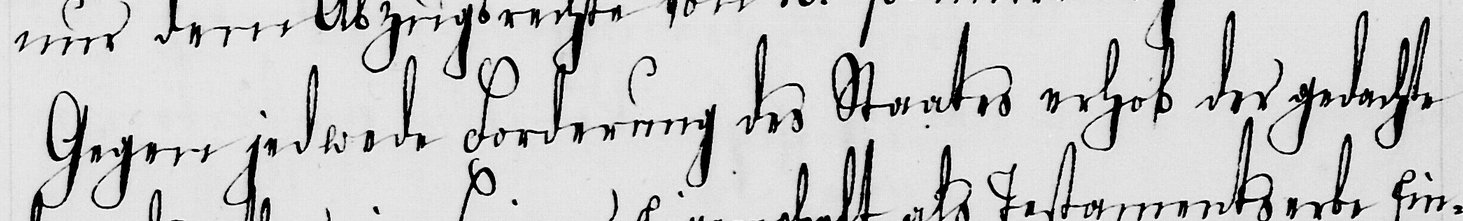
Gegen jedwede Forderung des Staates erhob der gedachte
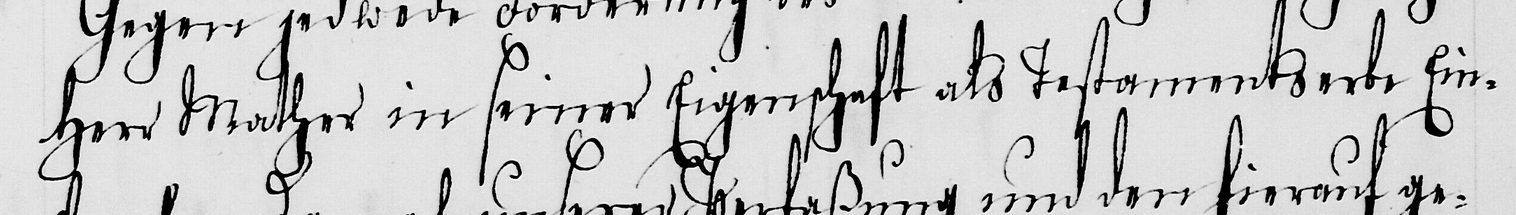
Herr Mather in seiner Eigenschaft als Testamentserbe Ein¬
